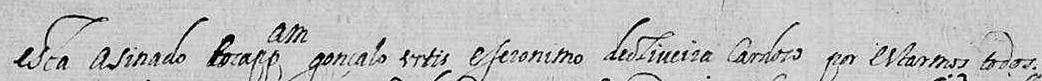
esta asinado do cappam gonçalo vrtis e Jeronimo de oliueira Cardozo por estarmos todos
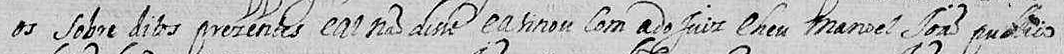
os sobreditos prezentes e al naõ disse e asinou com a do Juiz e heu manoel Ioaõ publico
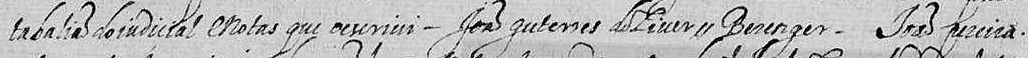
tabaliaõ do iudicial e notas que o escriui - João guterres doliuer // Berenger. Ioaõ pereira.
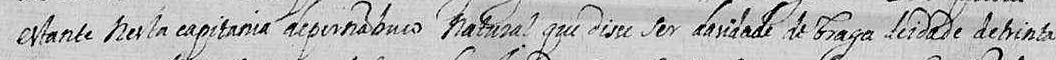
estante nesta capitania de pernābuco natural que disse ser da cidade de braga de idade de trinta
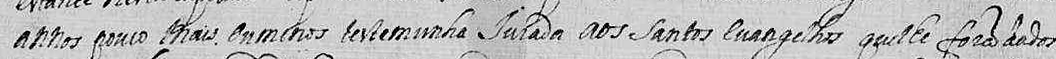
annos pouco mais ou menos testemunha Iurada aos Santos euangelhos que lhe foraõ dados
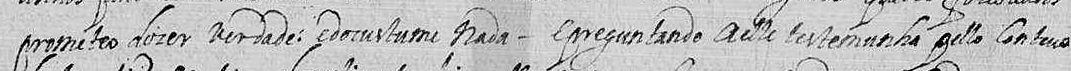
prometeo dizer verdade: e do custume nada = e preguntando a elle testemunha pello Conteu
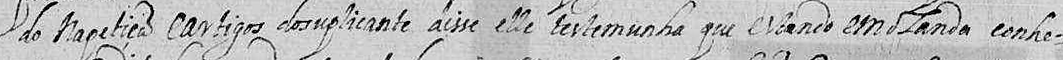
do na petiçaõ e artigos do suplicante disse elle testemunha que estando em olanda conhe
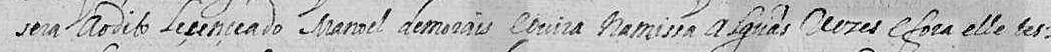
sera ao dito Lecenceado Manoel de morais e o uira na missa alguãs vezes e fora elle tes
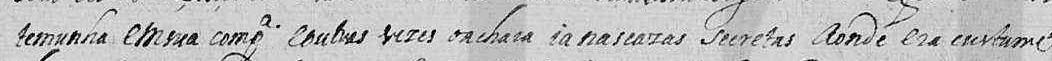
temunha em sua compa. e outras vezes o achara ia nas cazas secretas aonde era custume
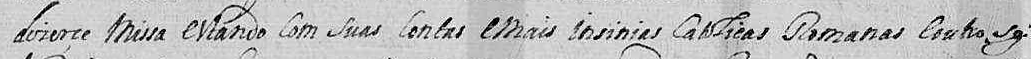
dizerce missa estando com suas contas e mais insinias Catolicas Romanas e outrosy
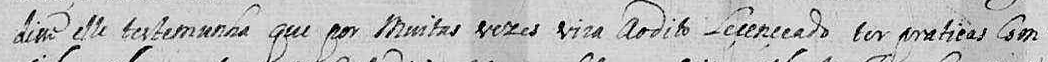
disse elle testemunha que por muitas vezes vira ao dito Lecenceado ter praticas com
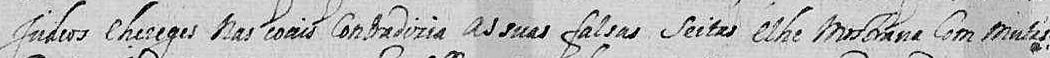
Judeos e hereges nas coais contradizia as suas falsas seitas e lhe mostraua com mutas
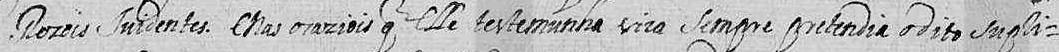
Rezois Iuidentes e nas ocaziois q̄ elle testemunha vira sempre pretendia o dito supli
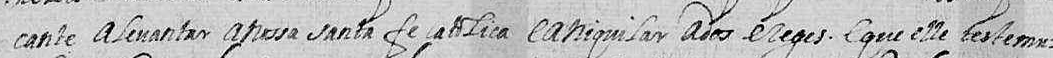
cante aleuantar a nossa santa fe catolica e aniquilar a dos ereges. E que elle testemu
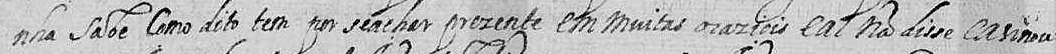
nha sabe como dito tem por se achar prezente em muitas ocaziois e al naõ disse e asinou
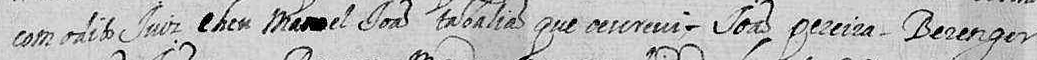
com o dito Iuiz e heu manoel Ioaõ tabaliaõ que o escreui - Ioaõ pereira Berenger
